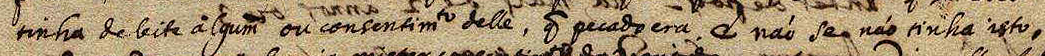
tinha deleite algum ou consentimto delle, q̄ pecado era. e naõ se naõ tinha isto,
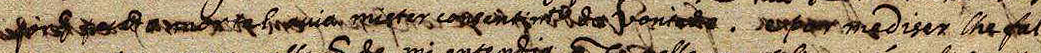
porq̄ _ _ tal auia mister consentimto da vontade. e por me diser lhe fal
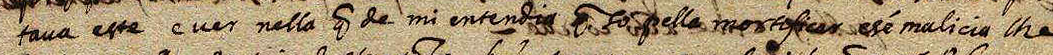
taua este e uer nella q̄ de mi entendia q̄ so pella mortificar e sē malicia lhe
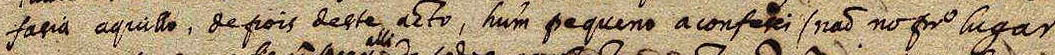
fasia aquillo, depois deste acto, hum pequeno a confesei (naõ no pro lugar
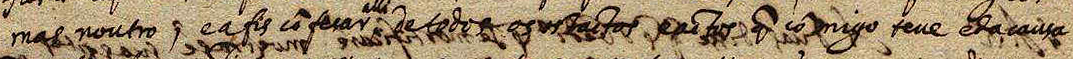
mas noutro) e a fis cōfesar alli de todos os os tactos e actos q̄ comigo teue e da causa
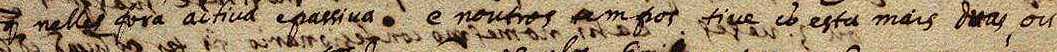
q̄ nelles fora actiua e passiua e noutros tempos tiue cō esta mais duas ou
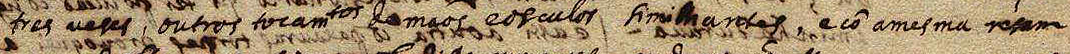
tres ueses, outros tocamtos de maõs e osculos similhantes, e cō a mesma resam
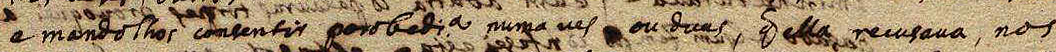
e mando lhos consentir por obedi.a numa ues ou duas, q̄ ella recusaua, nos
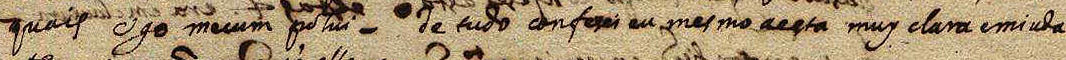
quais ego mecum polui - de tudo confesei eu mesmo a esta muy clara e miuda
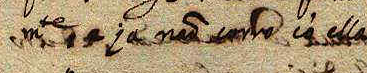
m.te e ja naõ corro cō ella
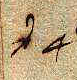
item 4a
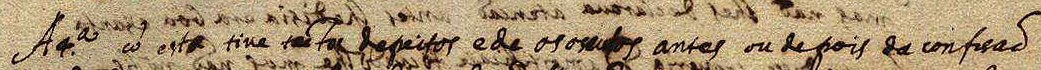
A 4a cō esta tiue tactos de peitos e de os osculos antes ou depois da confisaõ
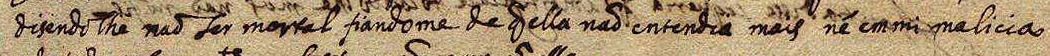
disendolhe naõ ser mortal fiandome de q̄ ella não entendia mais nē em mi malicia
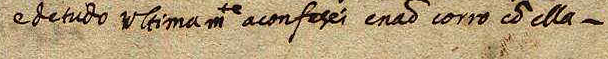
e de tudo vltimamte a confesei e naõ corro cō ella -
